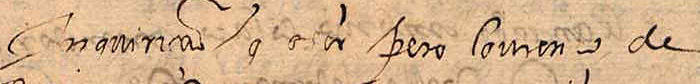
Jnquirição q̅ o sor̄ pero lourenço de
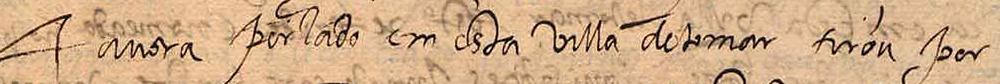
tauora perlado em esta villa de tomar tirou por
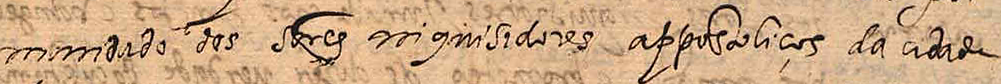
mamdado dos so̅res inquisidores appostoliços da cidade
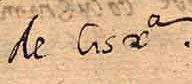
de lisxa.
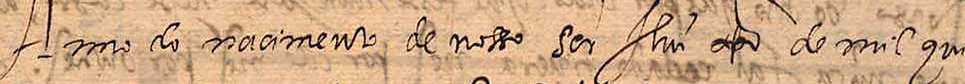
Anno do nacimeto de nosso so̅r Jhu̅ xpo̅ de mil qui
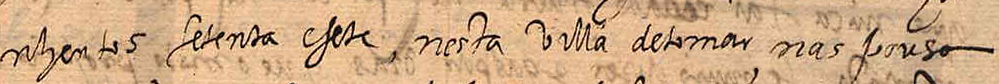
nhentos setenta e sete, nesta villa de tomar, nas pousa
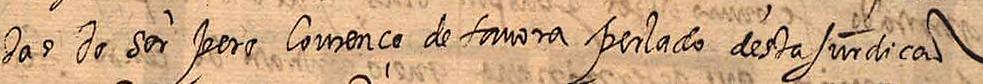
das do sor̄ pero lourenço de tauora perlado desta Jūrdicaõ
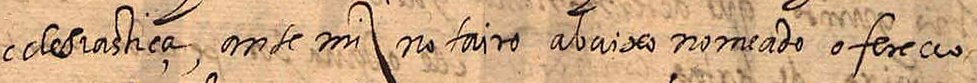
eclesiastiça, ante mī notairo abaixo nomeado ofereceo
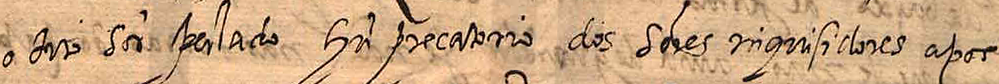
o dito so̅r perlado hu̅ precatorio dos so̅res inquisidores apos
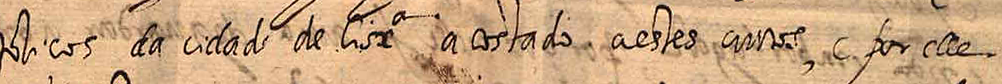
toliços da cidade de lisxa acostado a estes autos, e por elle
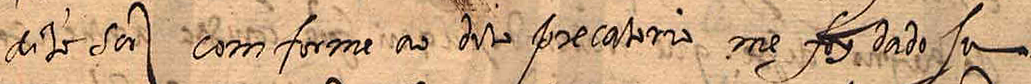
dito sor̄ comforme ao dito precatorio me foy dado Ju
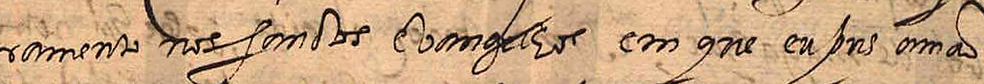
ramento nos sanctos evangelhos em que eu pus a mão
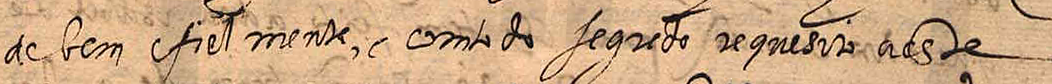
de bem e fielmente, e com todo segredo requesito a este
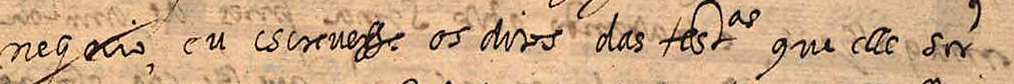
negocio, eu escreuesse os ditos das testas que elle sor̄
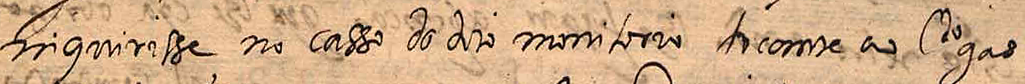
inquirisse no casso do dito monitorio tocante ao ldo gas
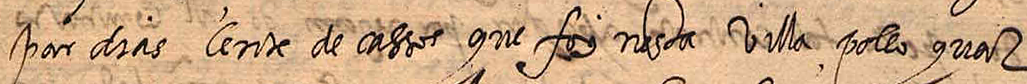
par dias lente de cassos que foy nesta villa pollo qual
